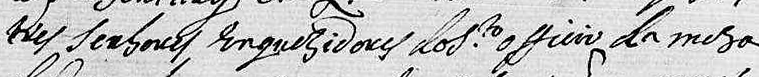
tres Senhores Enquezidores do s.to officio da mesa
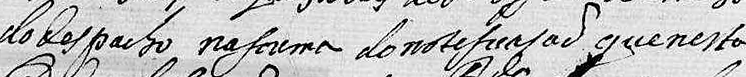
do despacho na forma de noteficasaõ que nesta
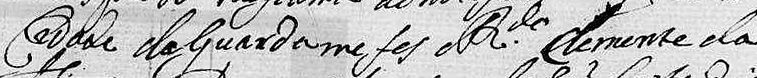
Cidade da Guarda me fes o R.do Clemente da
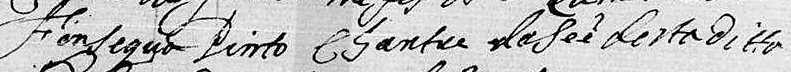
Fonsequa Pinto Chantre da Seé desta ditta
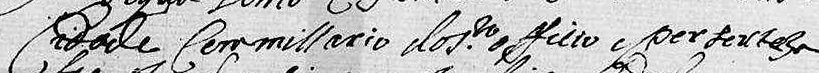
Cidade Commissario do s.to officio e per serteza
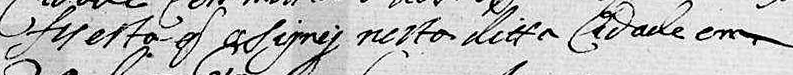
fis esta q̄ asignej nesta ditta Cidade em
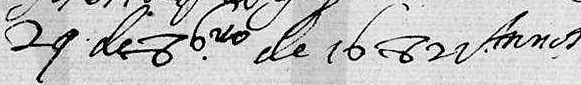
29 de 8.bro de 1682 Annos
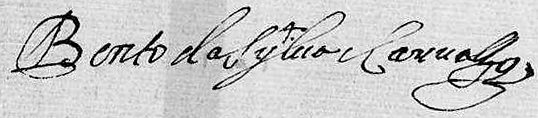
Bento da Sylua e Carualho
